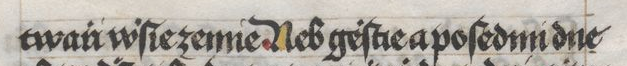twaṙi wẛie zemie.Neb geẛtie a poſedmi dne¬
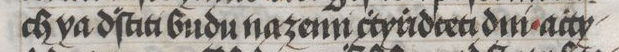ch ya dẛtiti budu nazemi ċtyṙidceti dní.a ċty¬
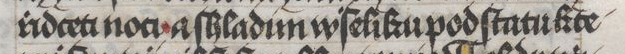ṙidceti noci.a ſhladím wẛeliku podſtatu kte¬
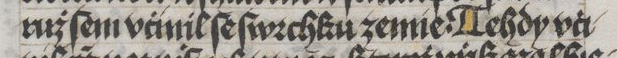ruż ſem vċínil ſe ſwrchku zemie.Tehdy vċi¬
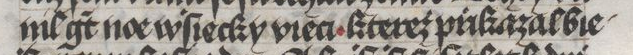nil ḡt noe wẛiecky vieci.ktereż pṙikazal bie¬
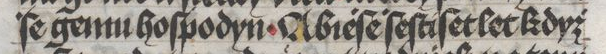ẛe gemu hoſpodyn. A bíeẛe ẛeſtiſet let kdyż
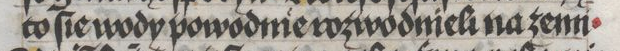to ſie wody powodnie rozwodnieli na zemi.
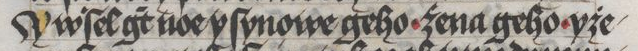Y wẛel ḡt noe y ſynowe geho.żena geho.yże¬
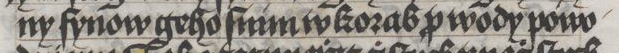ny ſynow geho ſním wkorab ꝓ wody powo¬
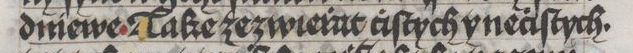dniewe.Take ze zwierat ċiſtych y neċiſtych.
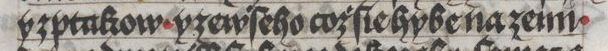y zptakow.y zewẛeho coż ſie hybe na zemi.
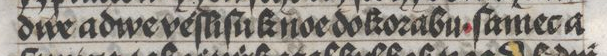dwe adwe veẛliſu k noe do korabu.ſamec a
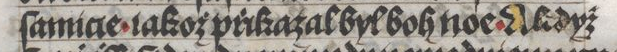ſamicie.iakoż pṙikażal byl boh noe.Akdyż
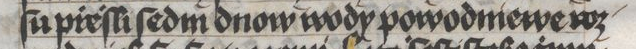ſu pṙeẛli ſedm dnow wody powodniewe roz¬
